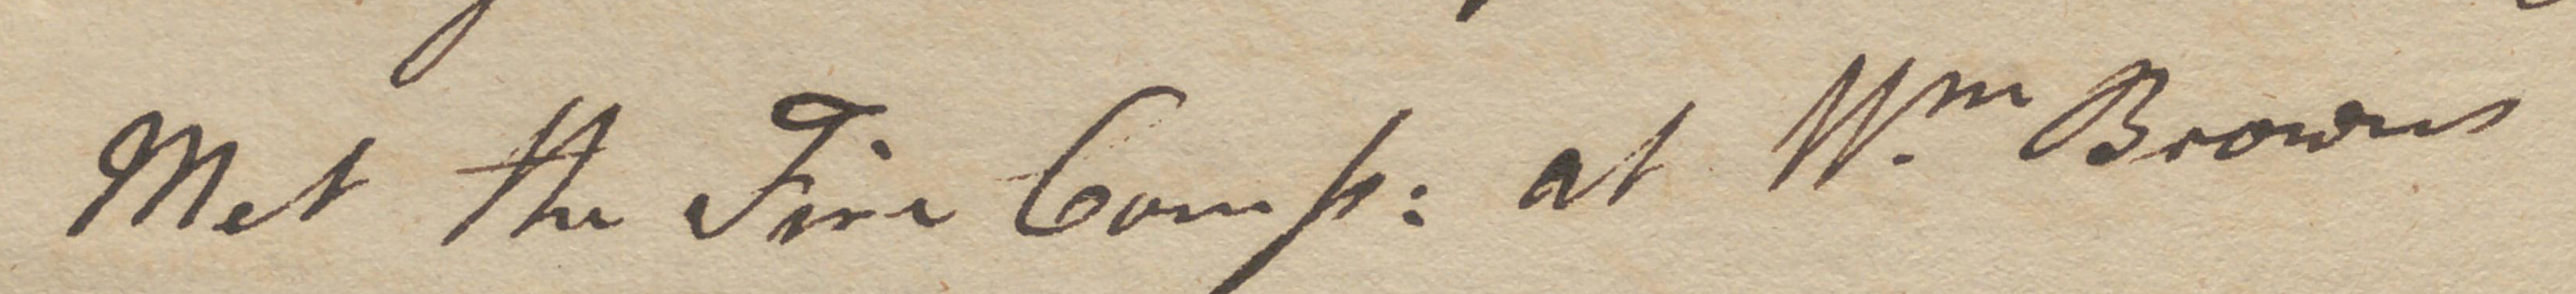Met the Fire Comp. at W^m. Browns
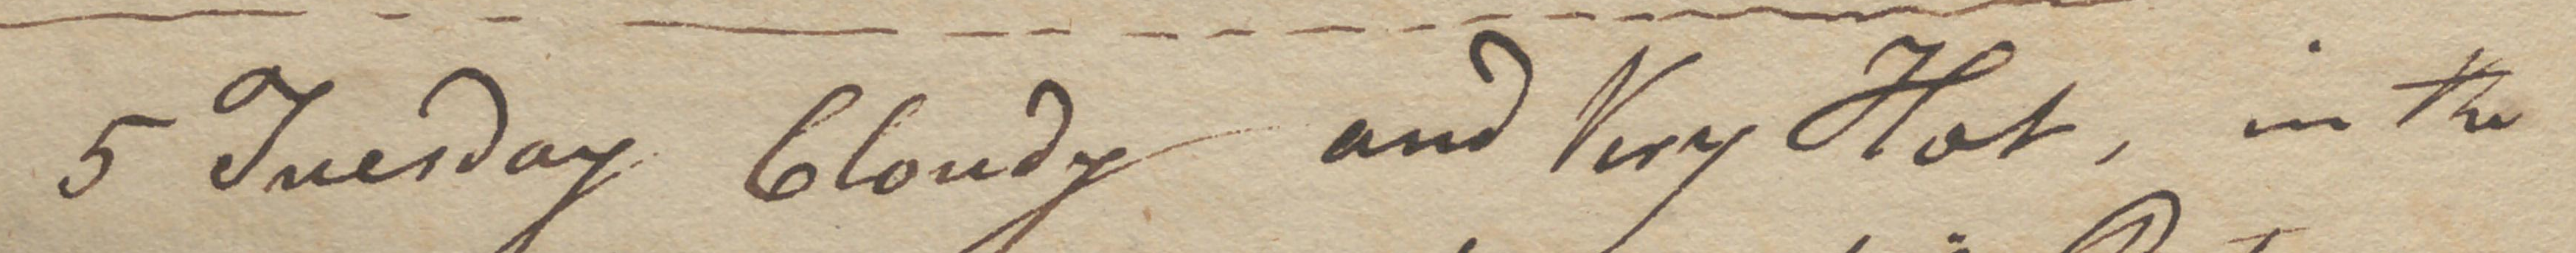5 Tuesday Cloudy and Very Hot, in the
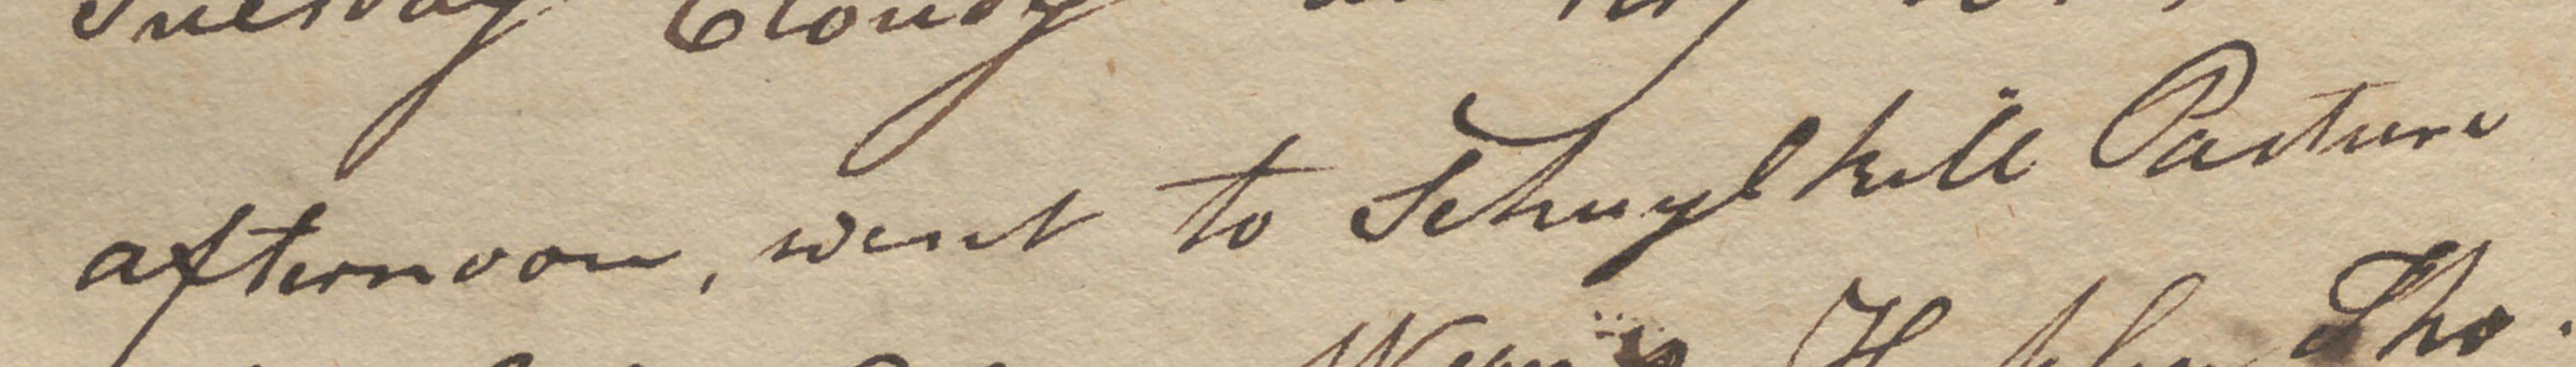afternoon, went to Schuylkill Pasture
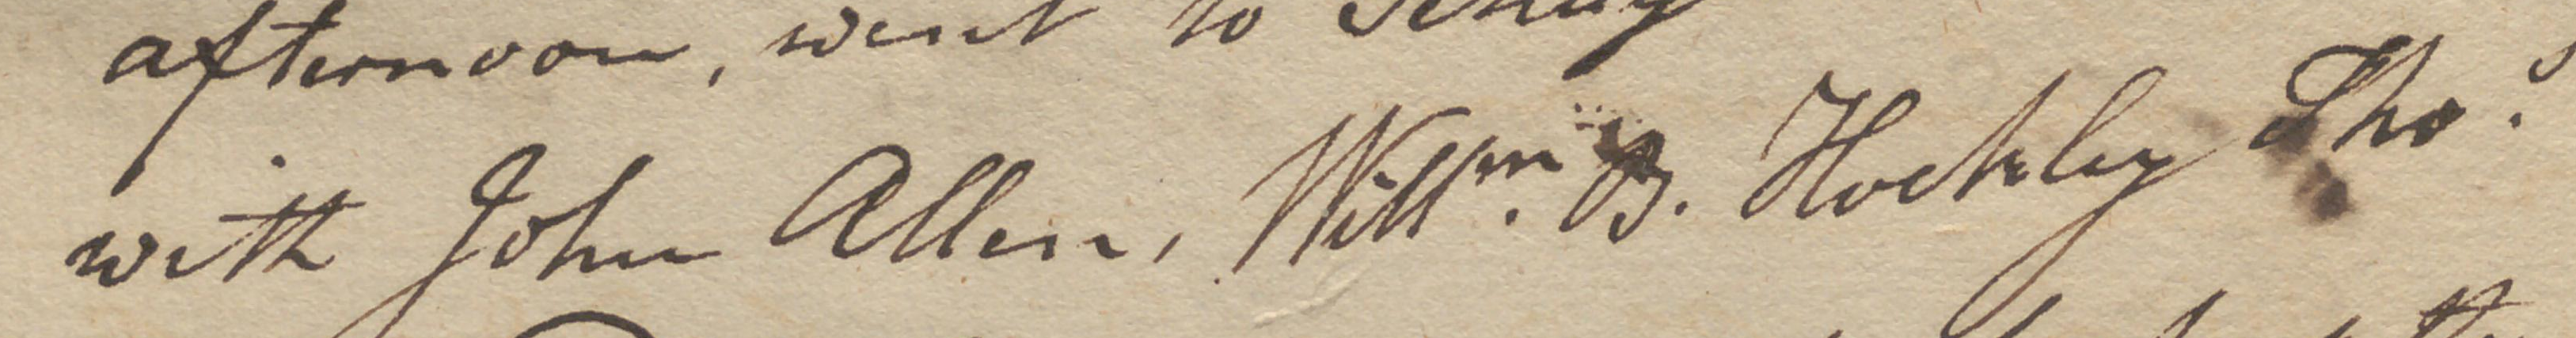with John Allen, Will^m. B. Hockley Tho^s.
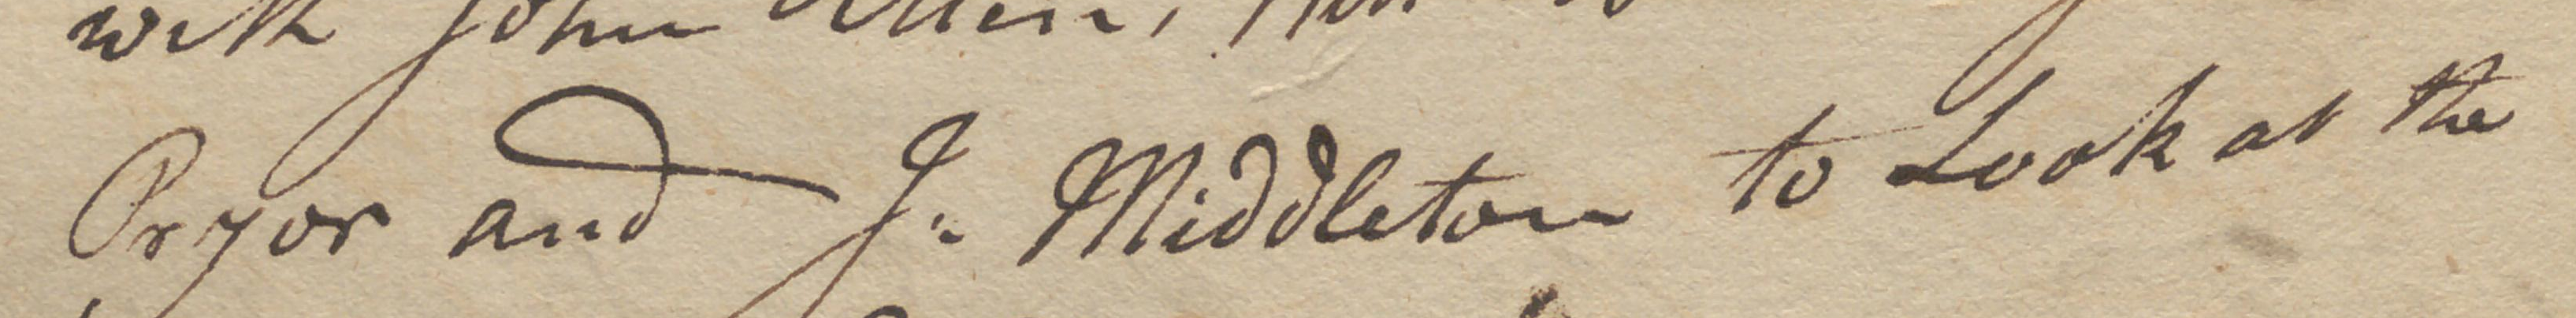Pryor and J. Middleton to Look at the
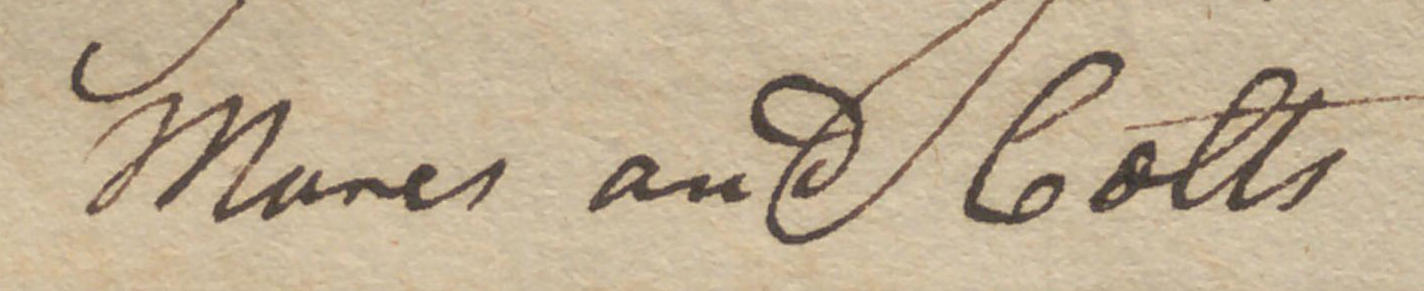Mares and Colts
